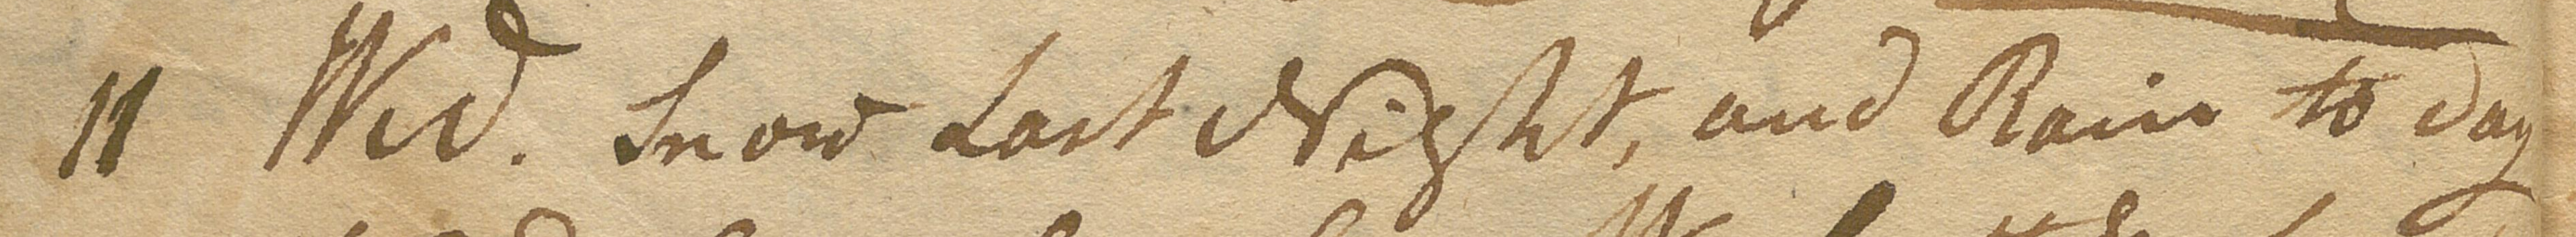11 Wed. snow Last Night, and Rain to day
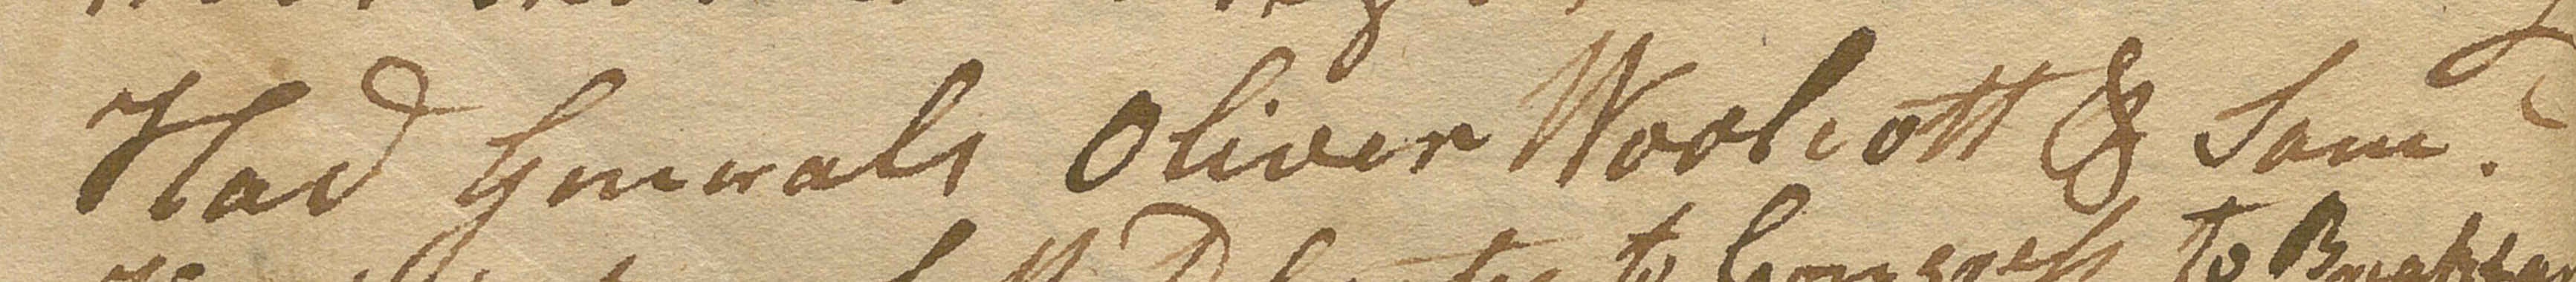Had Generals Oliver Woolcott & Sam
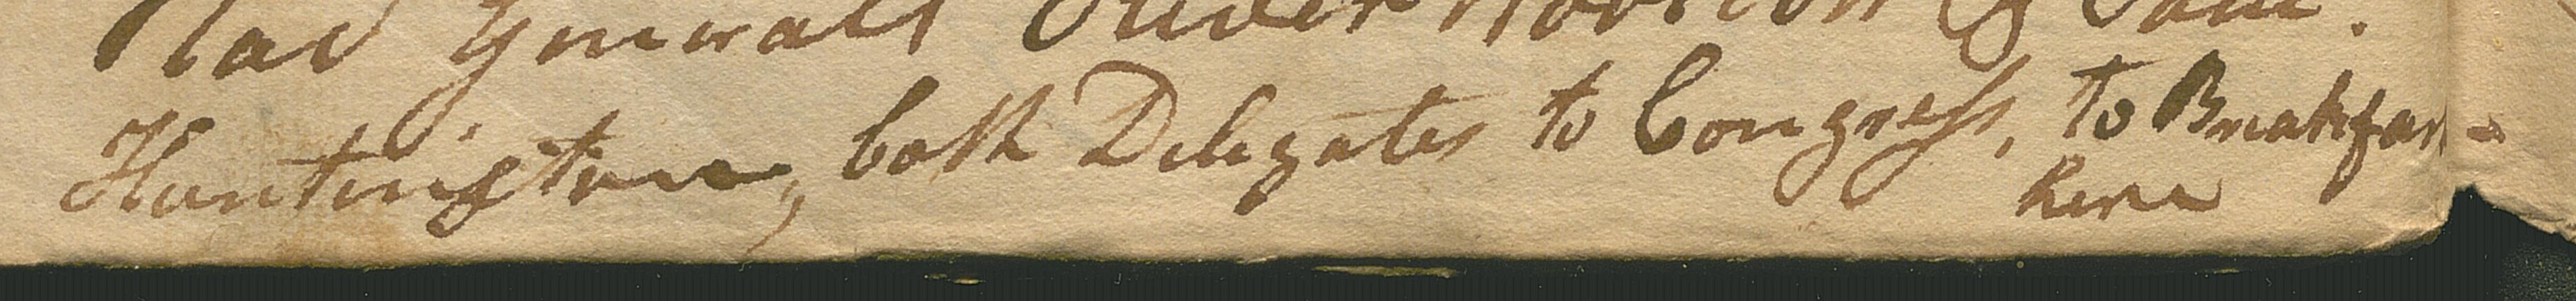Huntingtoan, both Deligates to Congress, to Breakfast
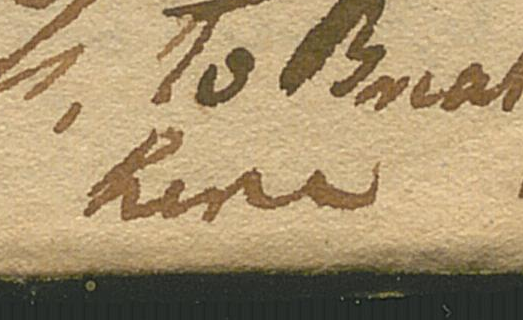here
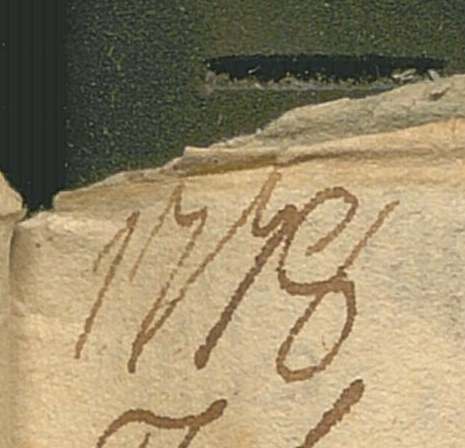1778
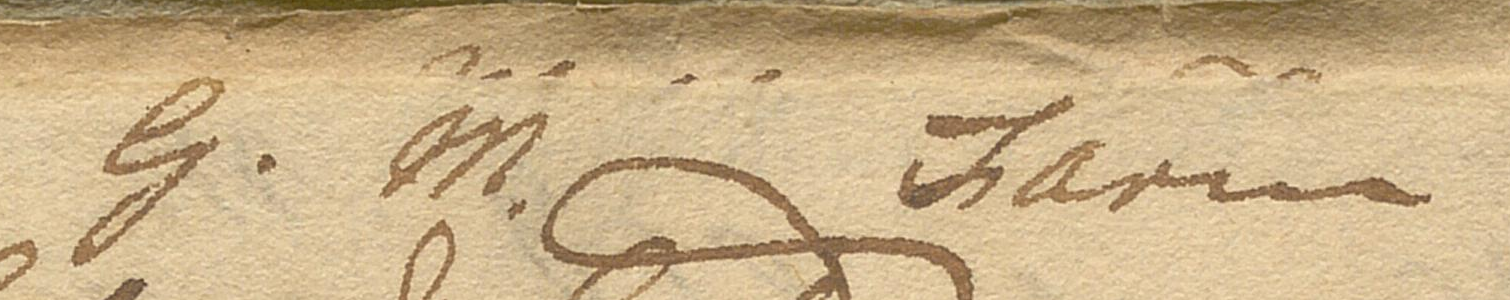G. M. Farn
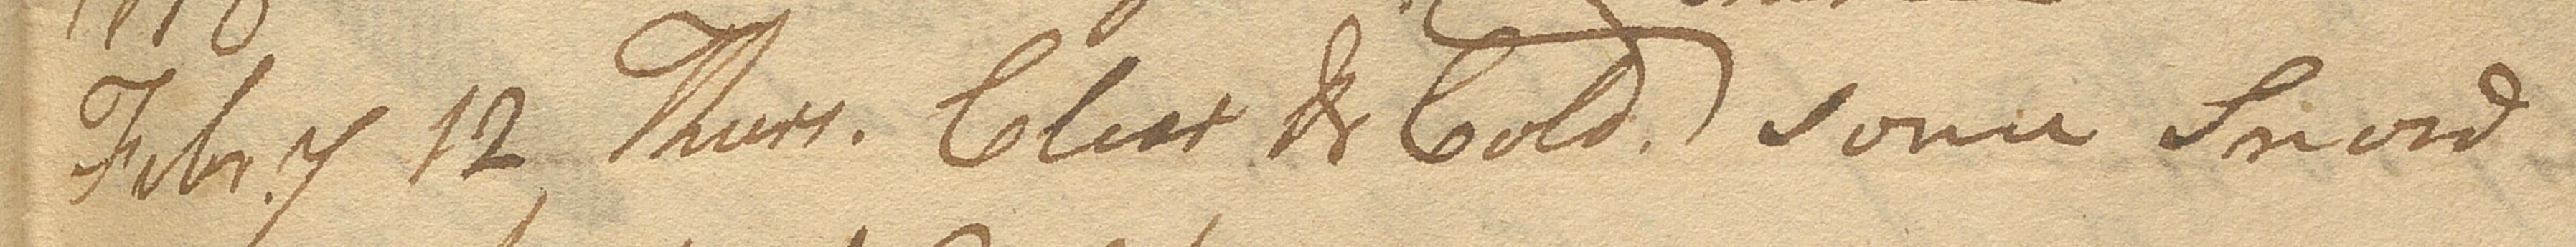Febr^y. 12 Thurs. Clear & Cold. some Snow
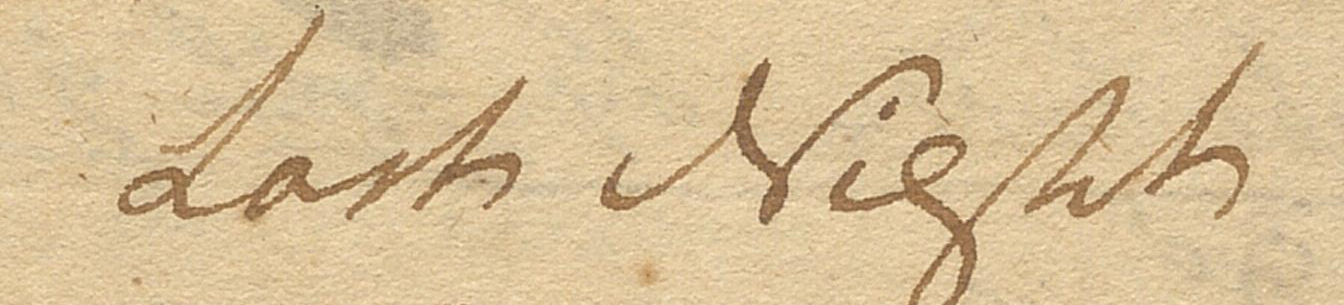Last Night
